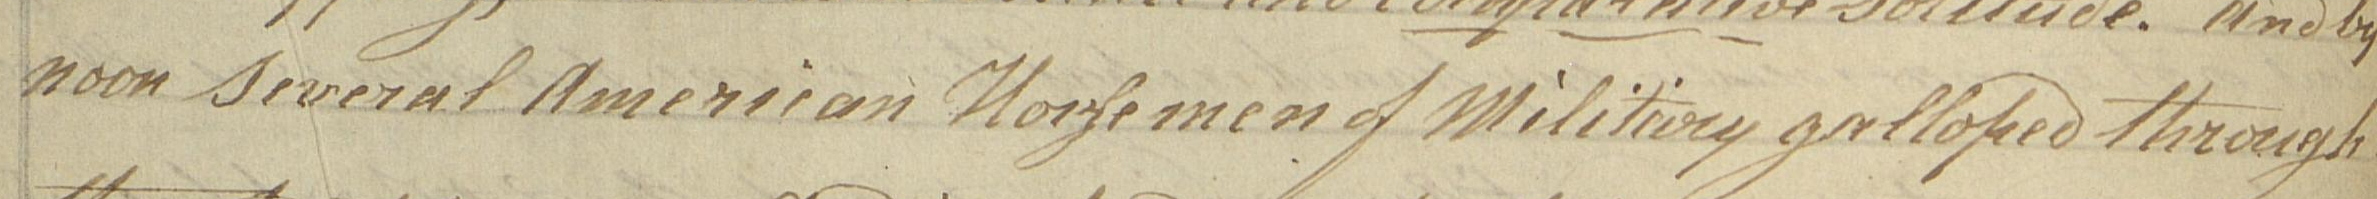noon several American Horsemen of Military galloped through
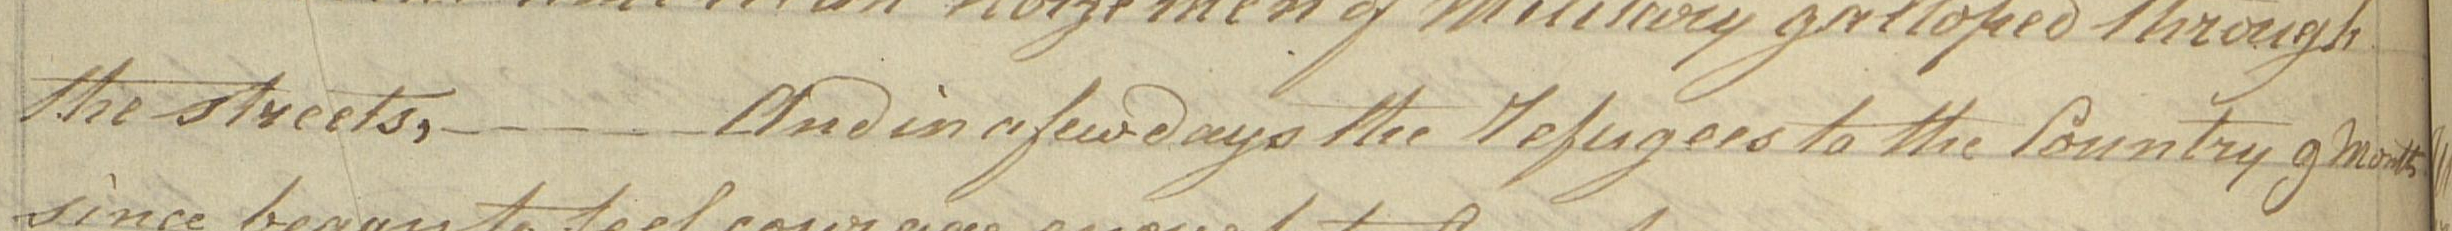the streets, And in a few days the Refugees to the Country 9 Month
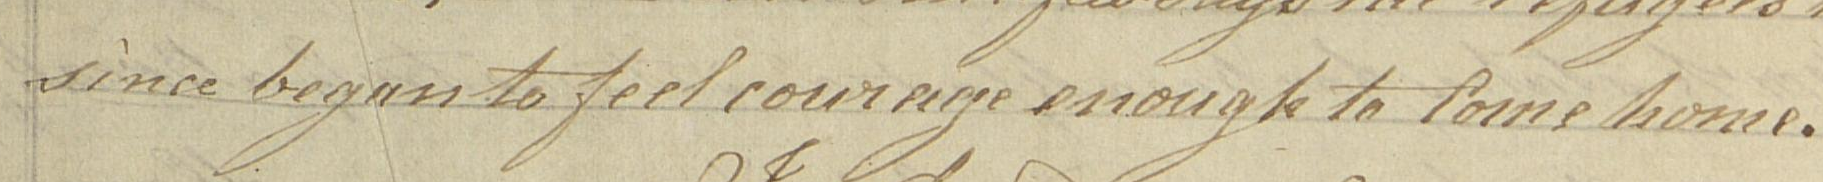since began to feel courage enough to Come home.
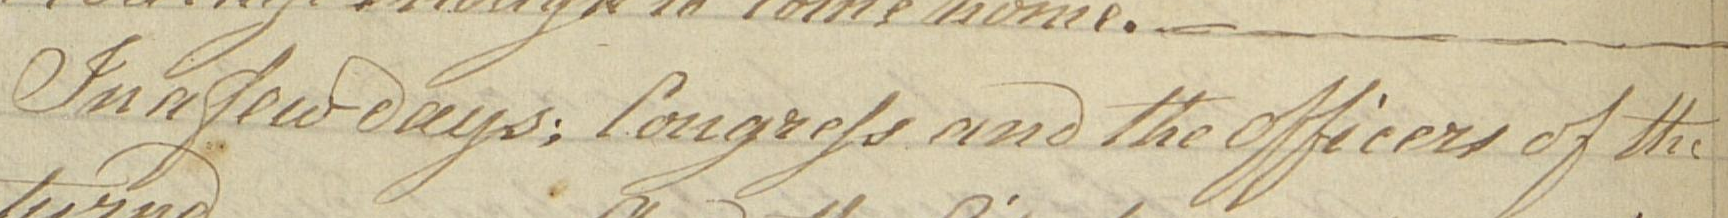In a few days; Congress and the officers of the
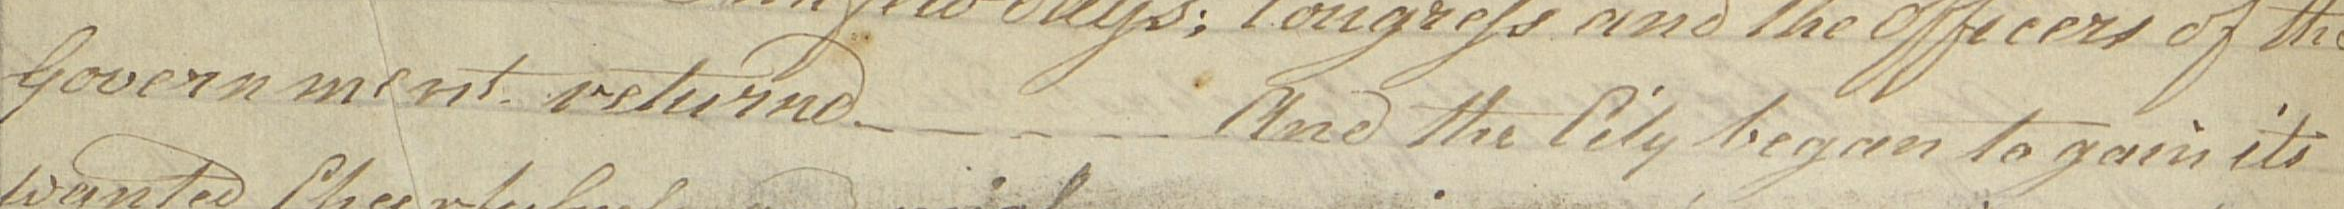Government returnd. And the City began to gains its
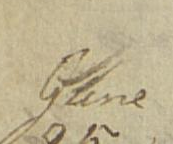June
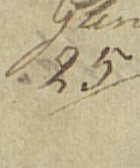25
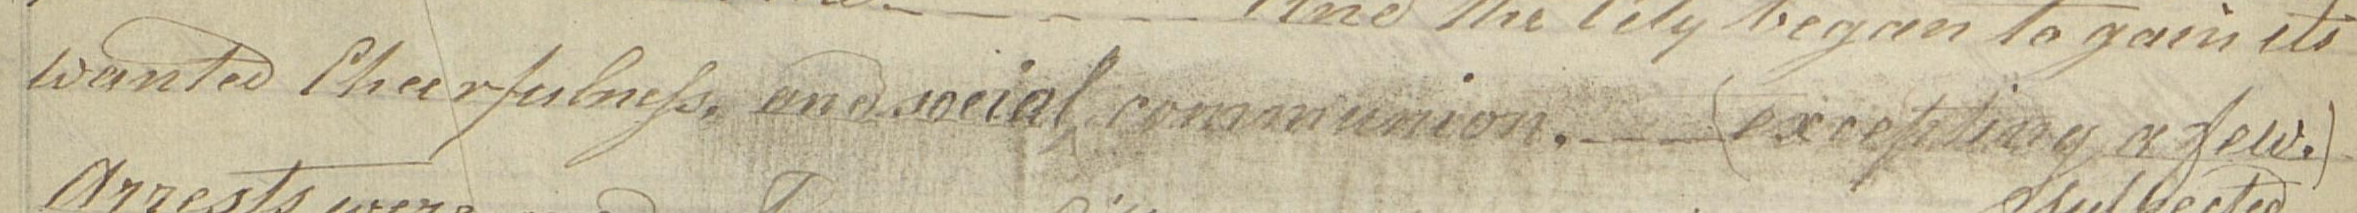wanted Chearfulness, and social communion. (excepting a few.)
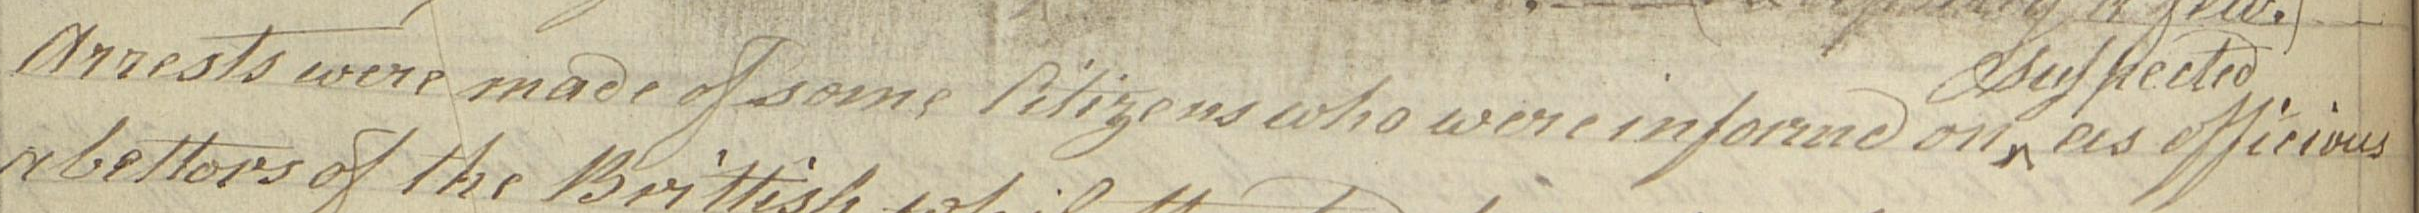Arrests were made of some Citizens who were informd on ^ as officious
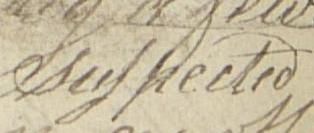Suspected
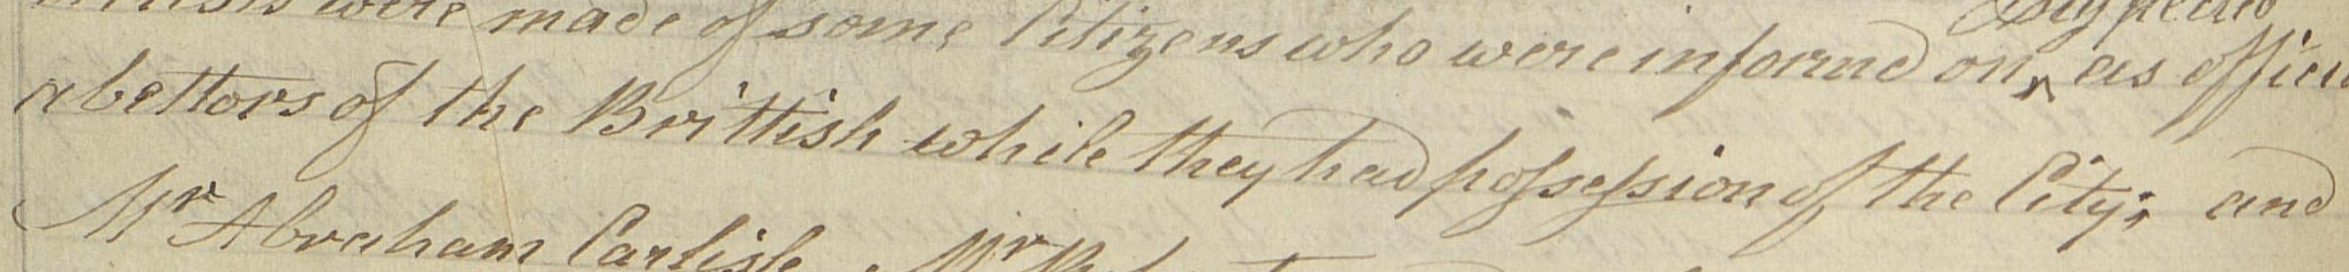abettors of the Brittish which they had possession of the City; and
